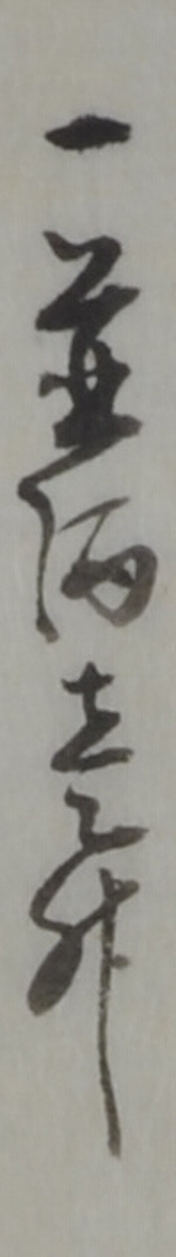一片白壱升
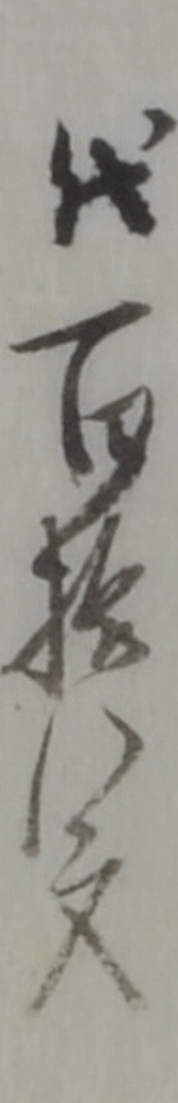代百三拾文
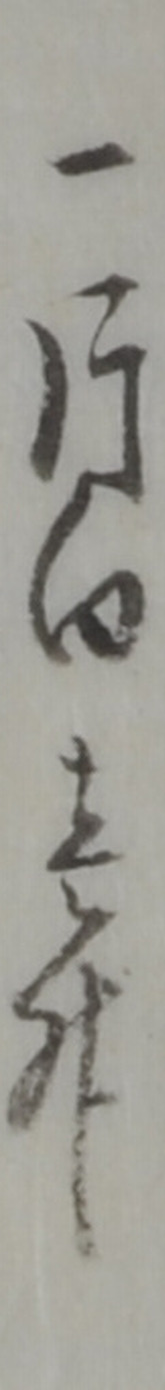一片白壱升
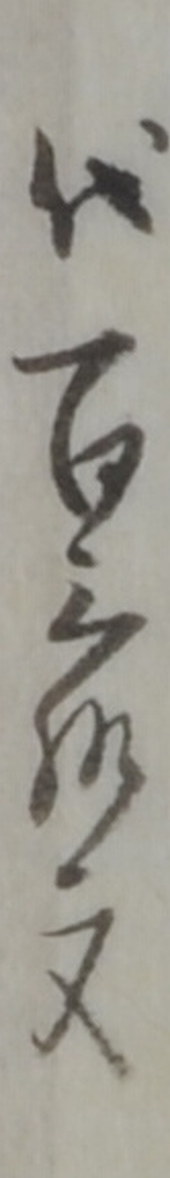代百三拾文

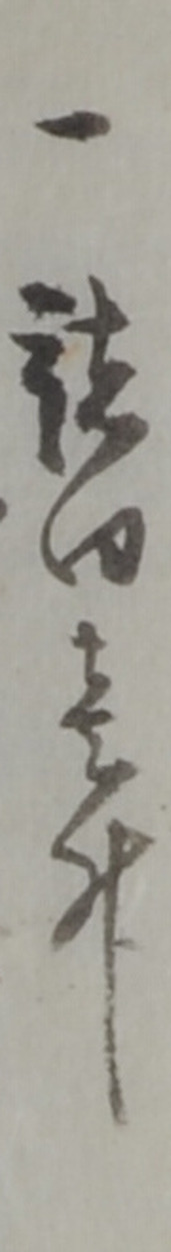一諸白壱升
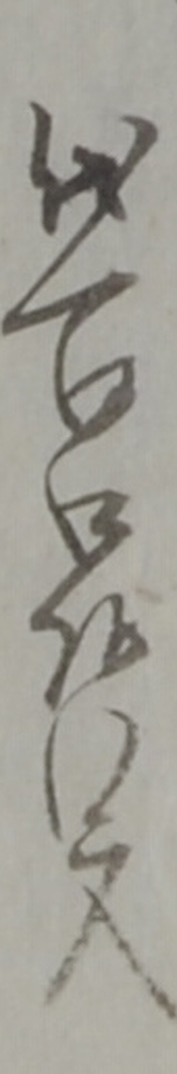代百四拾八文
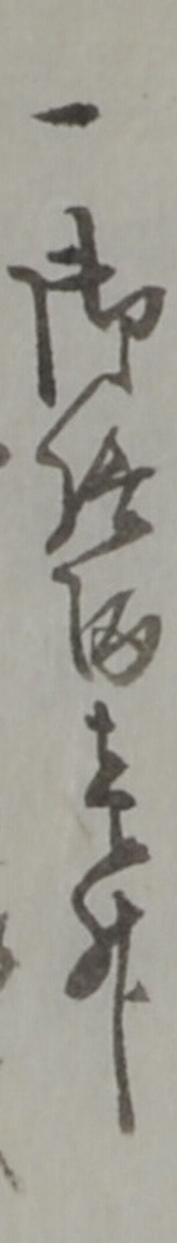一御清酒壱升
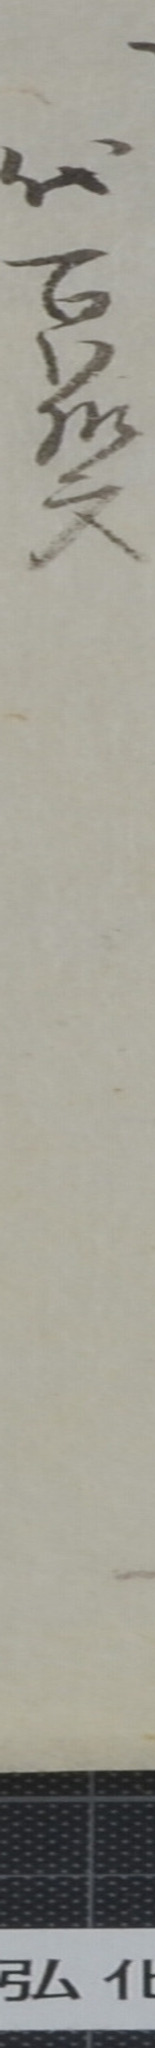代百八拾文
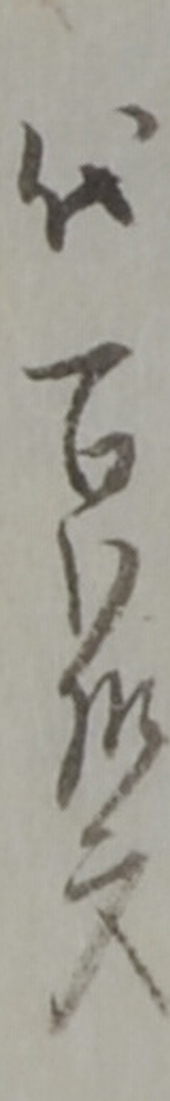代百八拾文
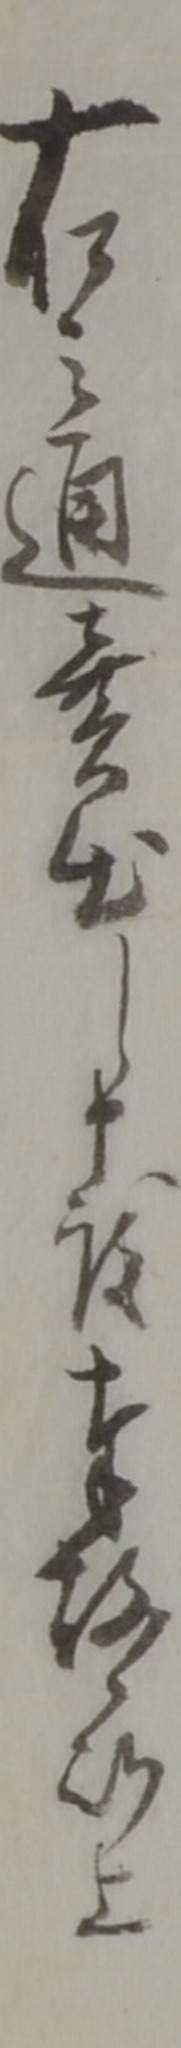右之通売出し申度奉存候以上
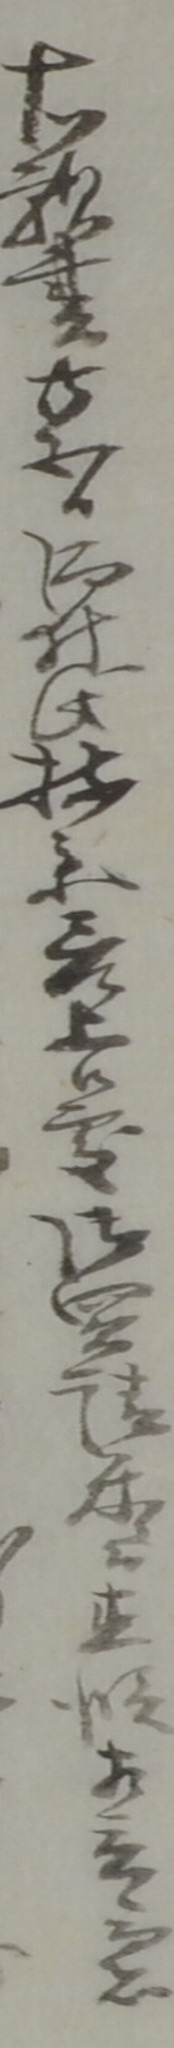右願書廿五日酒杜氏持参差上候處御買請米ニ而直段相立候而者
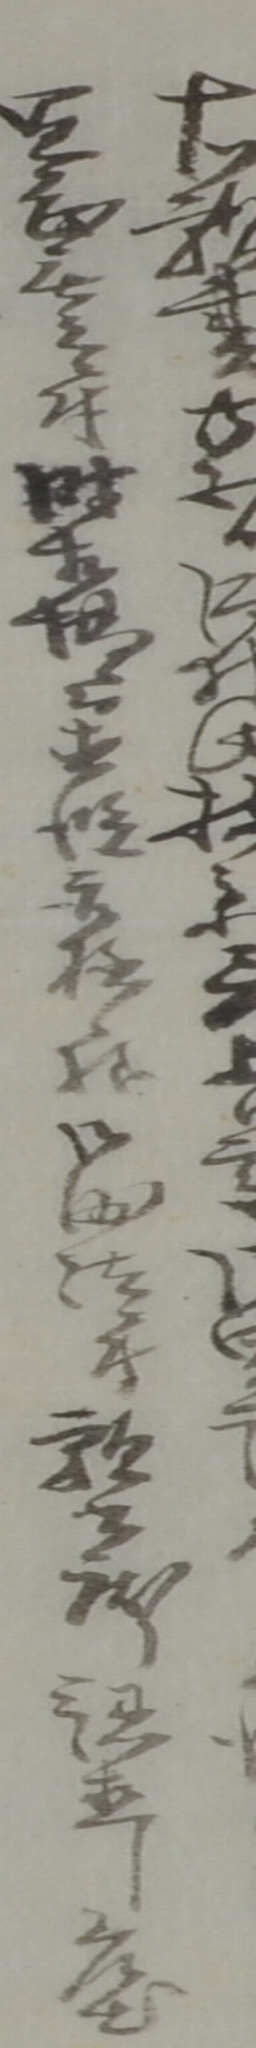益も無之ニ付時相場ニ而直段取極候様御沙汰ニ付願書戻し認直し差出
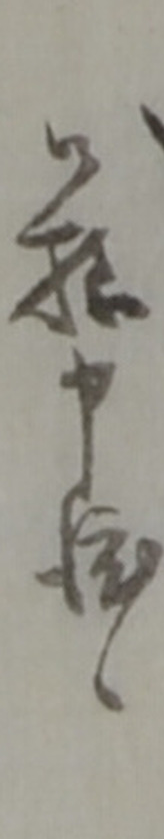候様申渡候
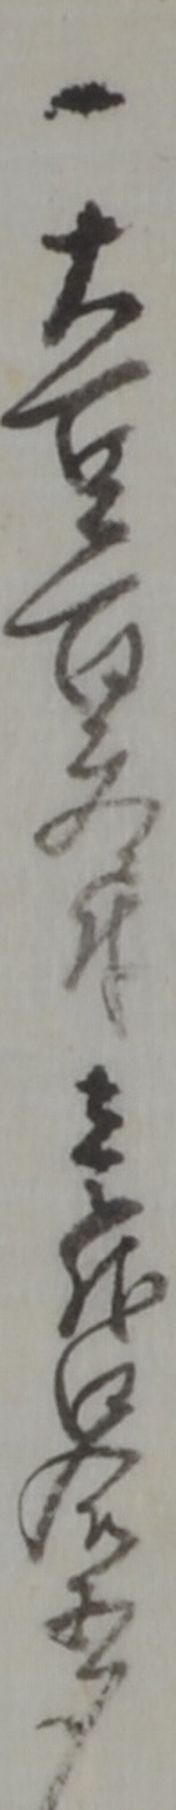一大豆百文ニ付壱升四合五勺
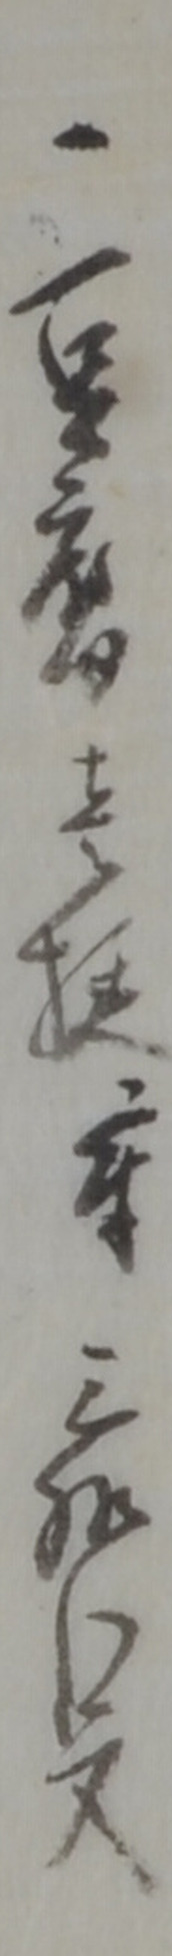一豆腐壱挺ニ付三拾八文
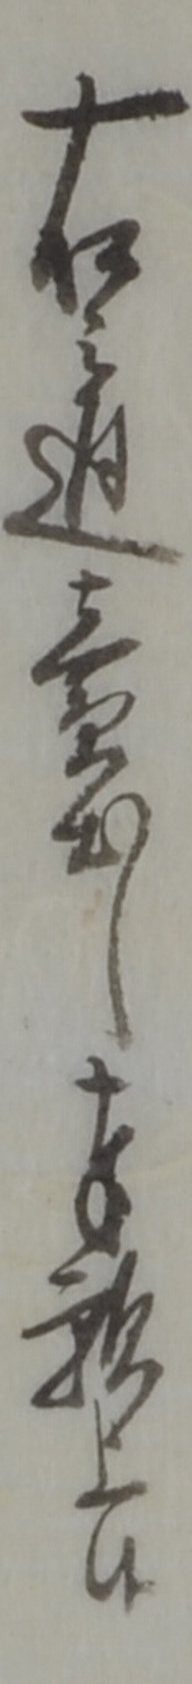右之通売出し奉願上候
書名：諸願書控簿
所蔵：伊那市立高遠町図書館・合同会社AMANE
